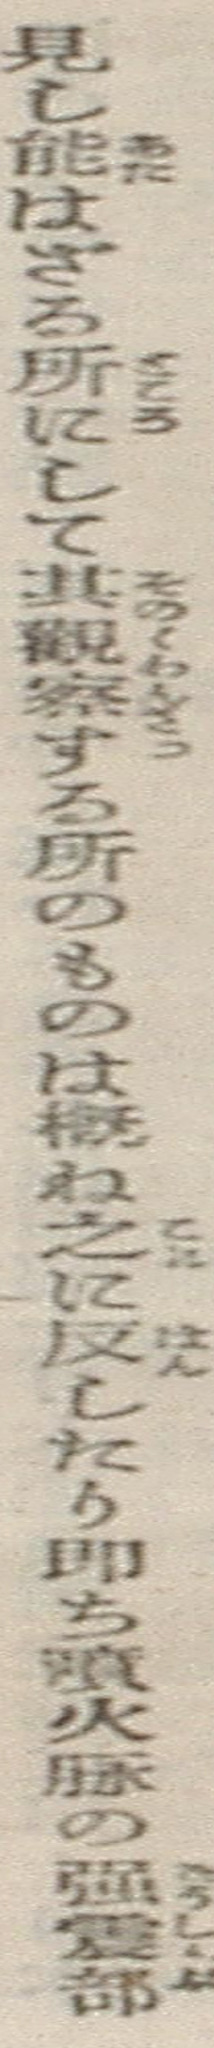見し能はざる所にして其観察する所のものは概ね之に反したり即ち噴火脈の強震部
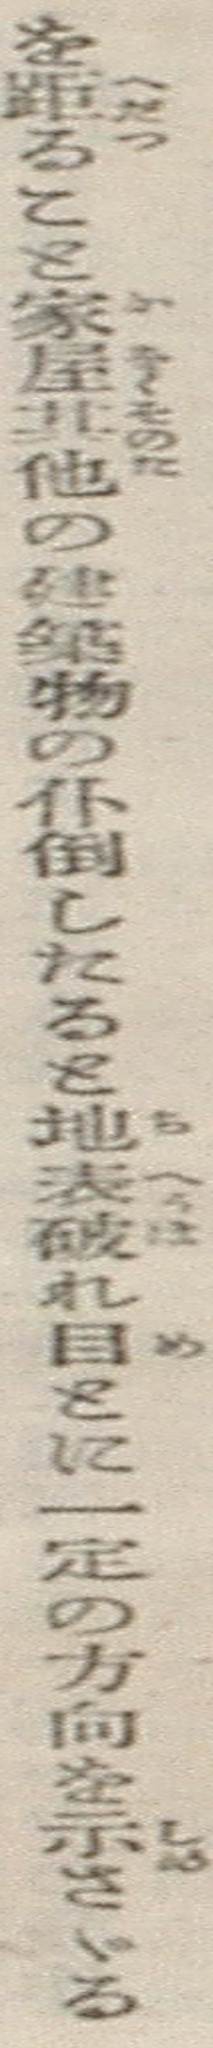を距ること家屋其他の建築物の仆倒したると地表破れ目とに一定の方向を示さゞる
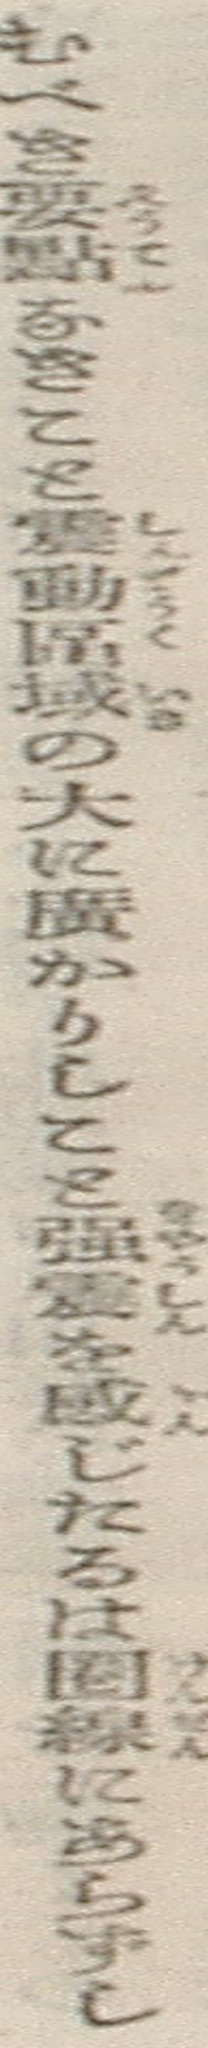むべき要点なきこと震動區域の大に広かりしこと強震を感じたるは圈線にあらずし
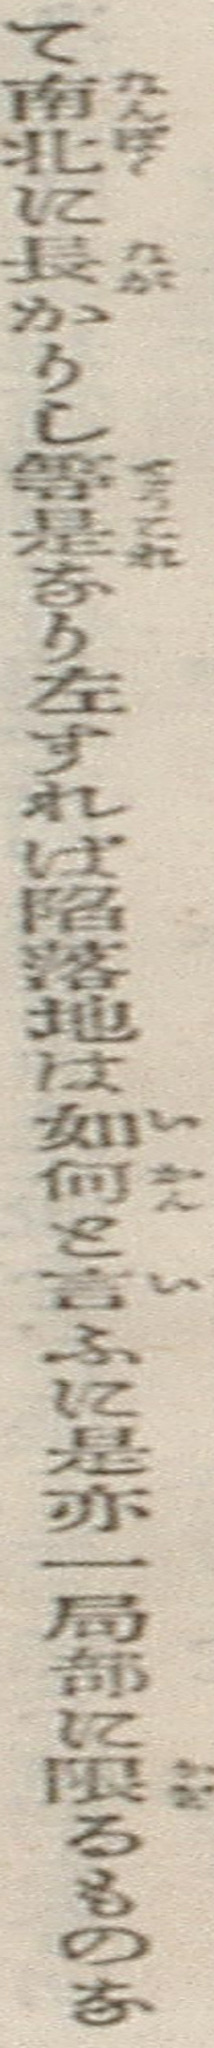て南北に長かりし等是なり左すれば陥落地は如何と言ふに是亦一局部に限るものな
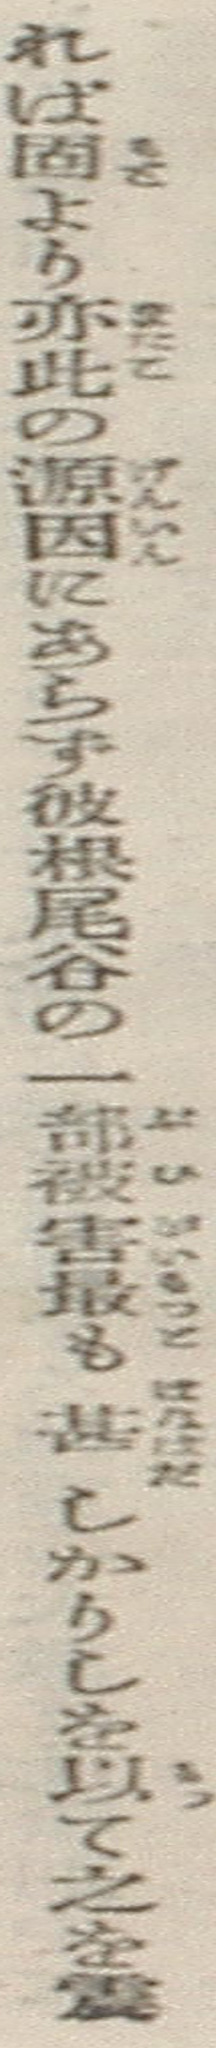れば固より亦此の源因にあらず彼根尾谷の一部被害最も甚しかりしを以て之を震
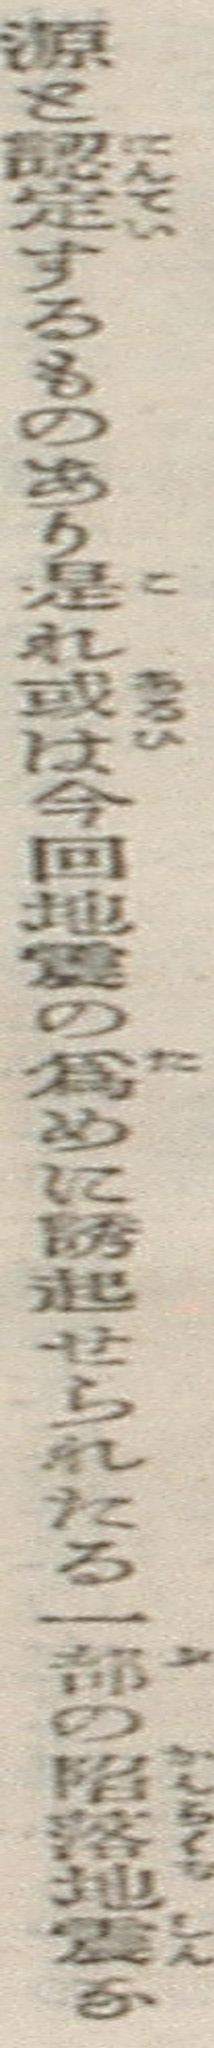源と認定するものあり是れ或は今回地震の為めに誘起せられたる一部の陥落地震な
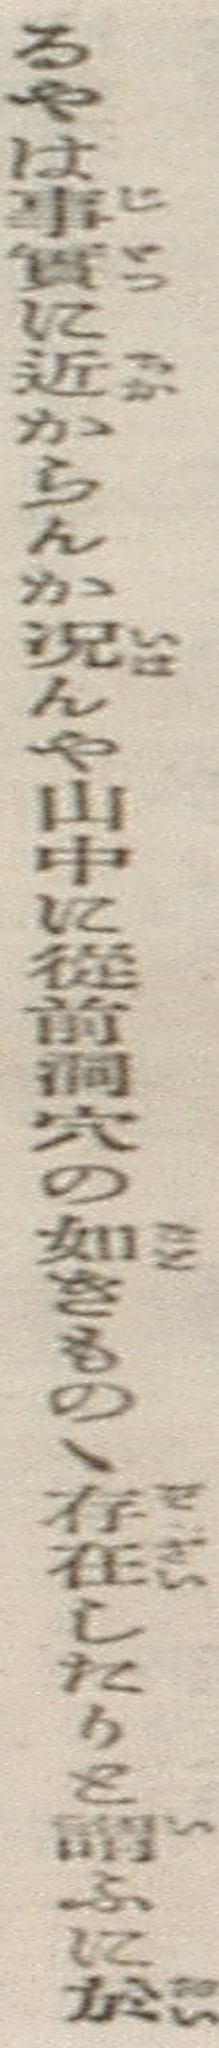るやは事実に近からんか況んや山中に従前洞穴の如きものゝ存在したりと謂ふに於
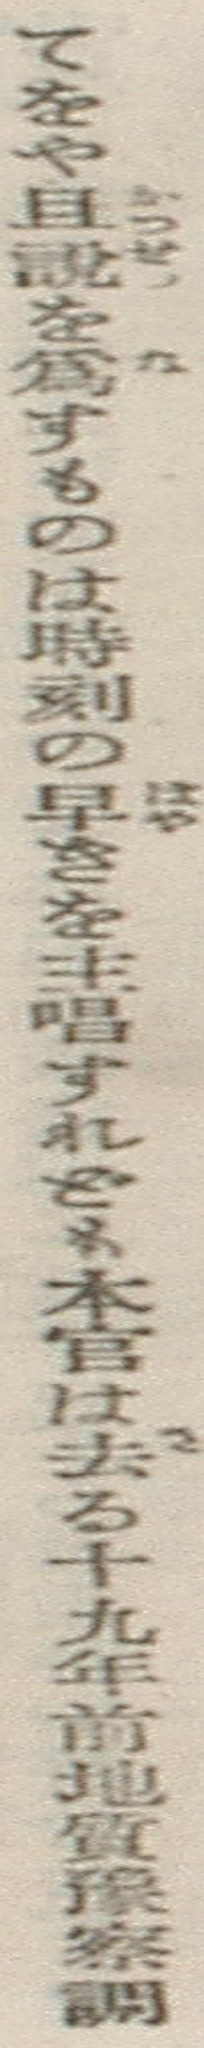てをや且説を為すものは時刻の早きを主唱すれども本官は去る十九年前地質予察調
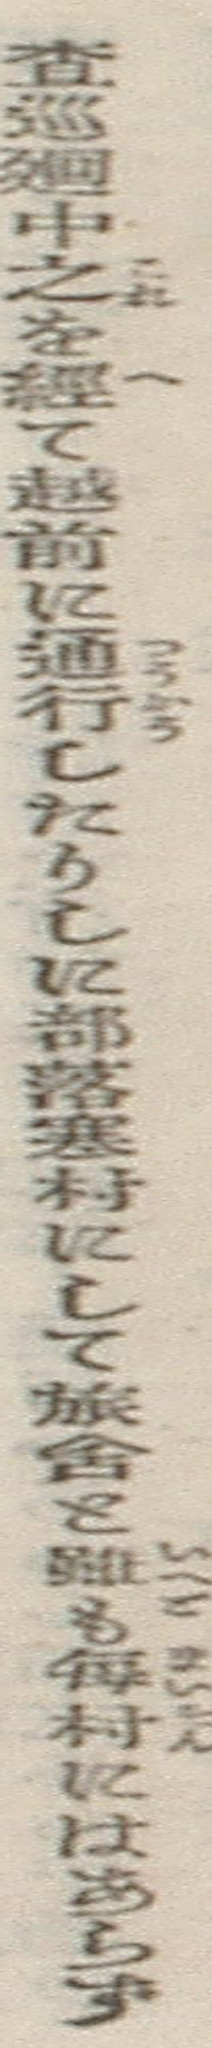査巡廻中之を経て越前に通行したりしに部落寒村にして旅舎と雖も毎村にはあらず

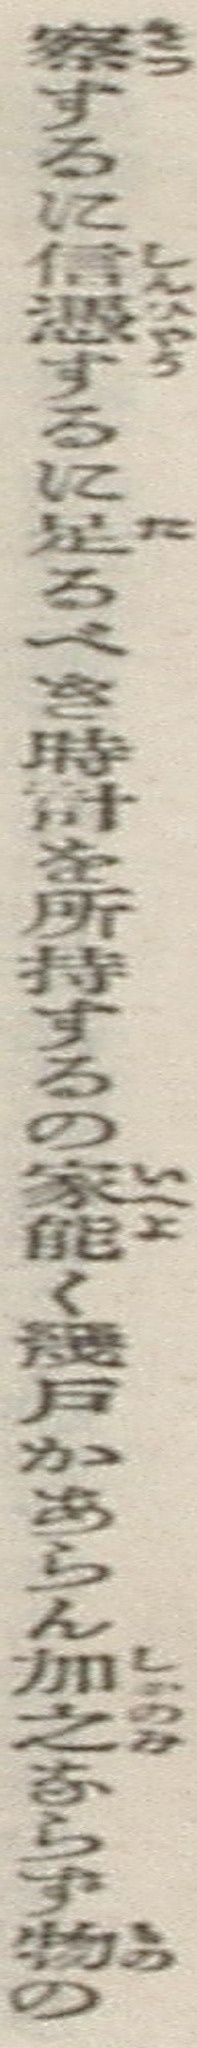察するに信憑するに足るべき時計を所持するの家能く幾戸かあらん加之ならず物の
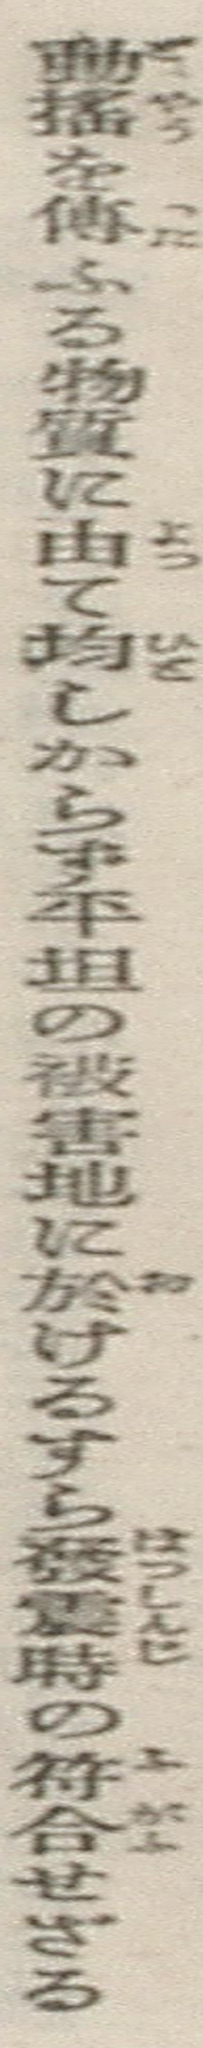動揺を伝ふるに物質に由て均しからず平坦の被害地に於けるすら発震時の符合せざる
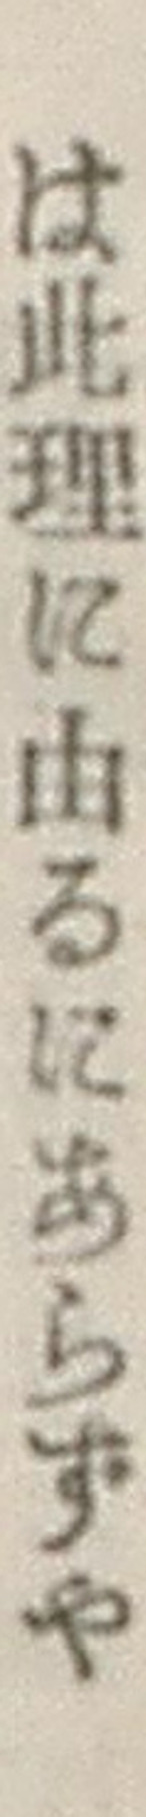は此理に由るにあらずや
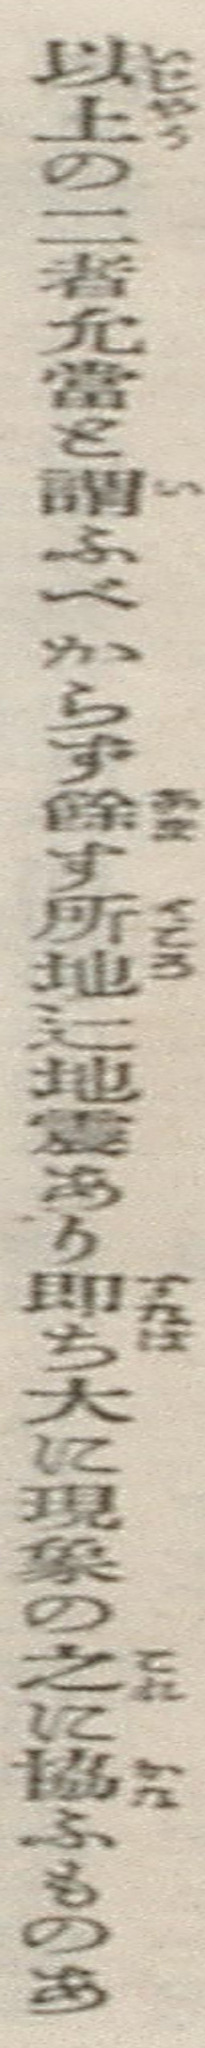以上の二者允当と謂ふべからず余す所地辷地震あり即ち大に現象の之に協ふものあ
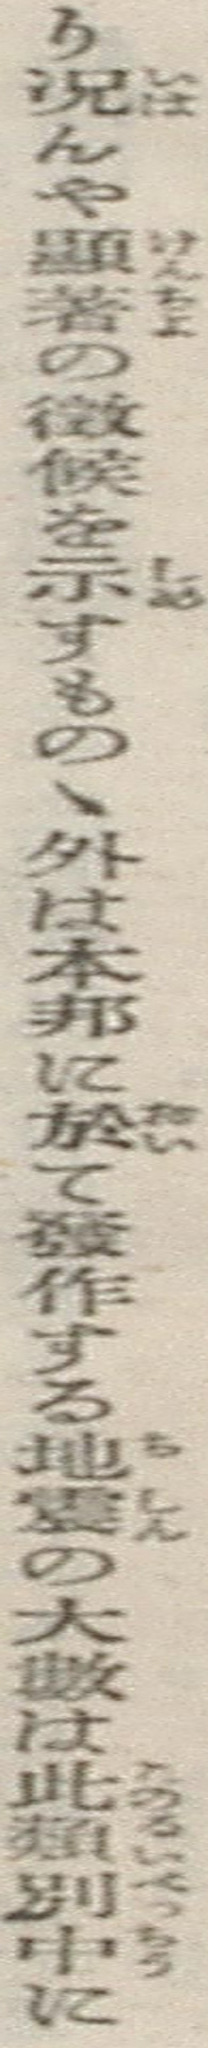り況んや顕著の徴候を示すものゝ外は本邦に於て発作する地震の大数は此類別中に
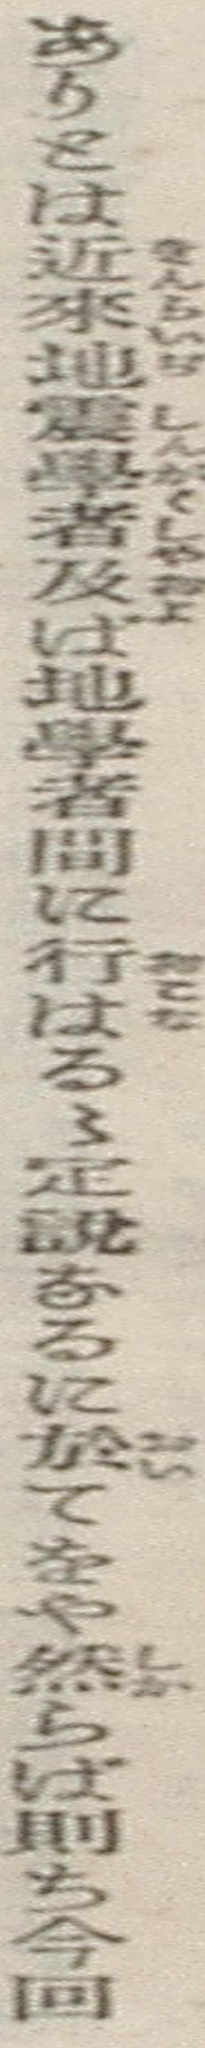ありとは近来地震学者及ば地学者間に行はる〻定説なるに於てをや然らば則ち今回
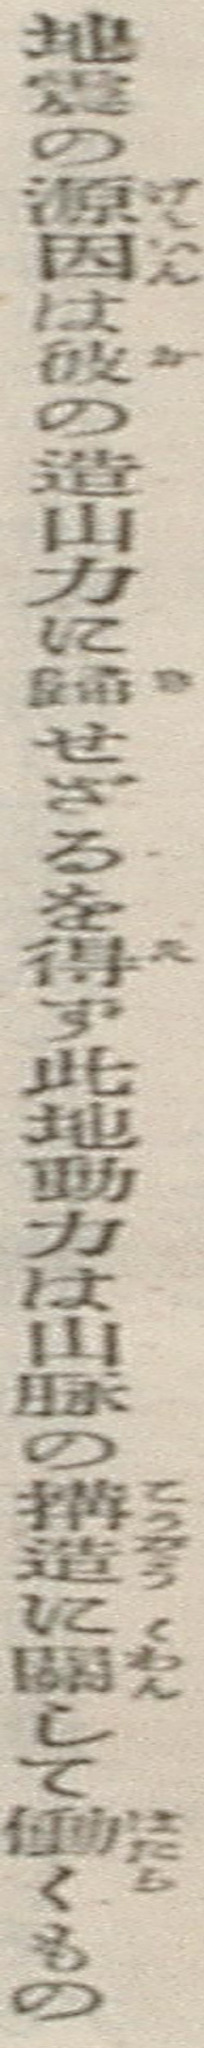地震の源因は彼の造山力に帰せざるを得ず此地動力は山脈の搆造に関して働くもの
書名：愛知岐阜福井三県　大地震見聞録（内題）
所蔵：東京大学地震研究所図書室 Earthquake Research Institute Library, The University of Tokyo, JAPAN
